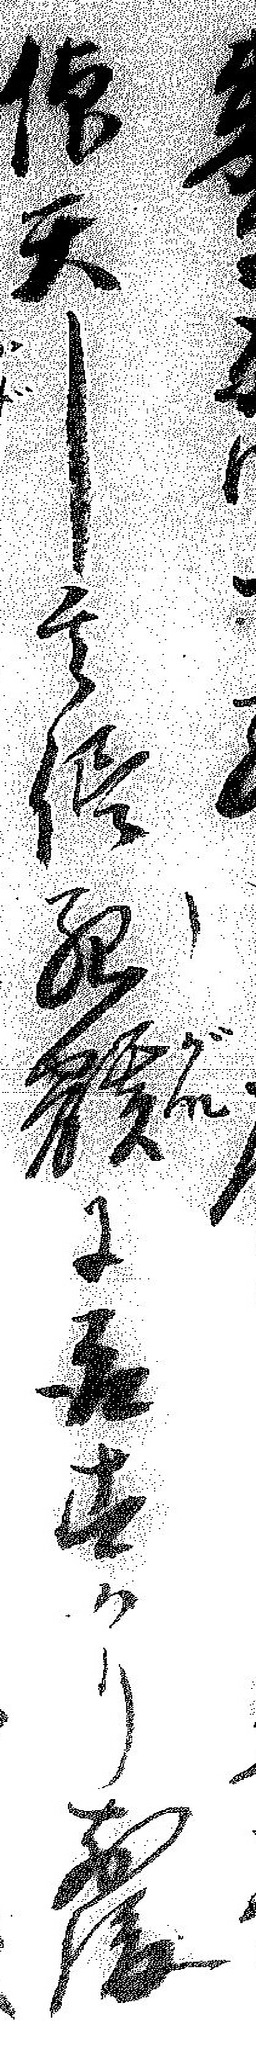仰天し其侭死骸に取すかり前後
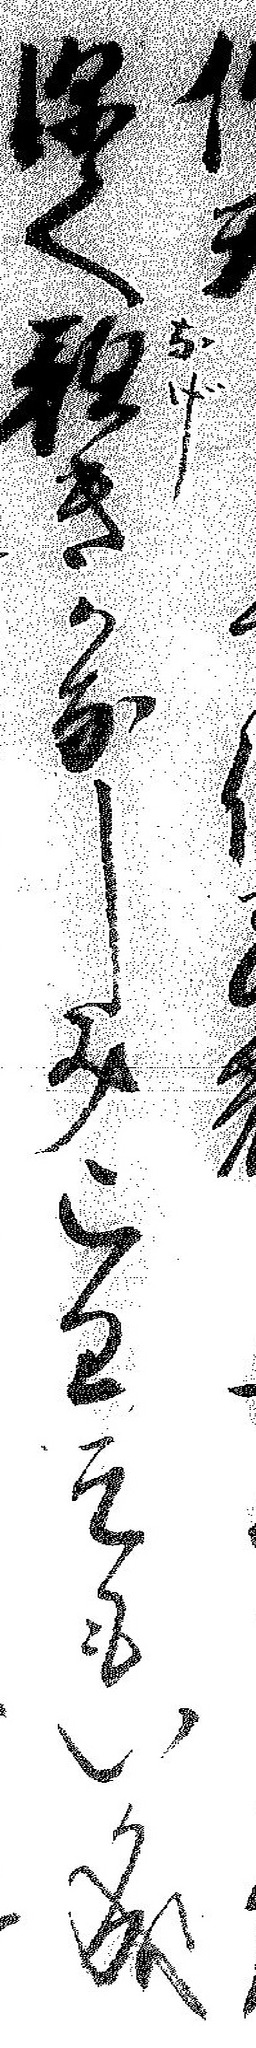深く歎きかなしみこわそもいか成
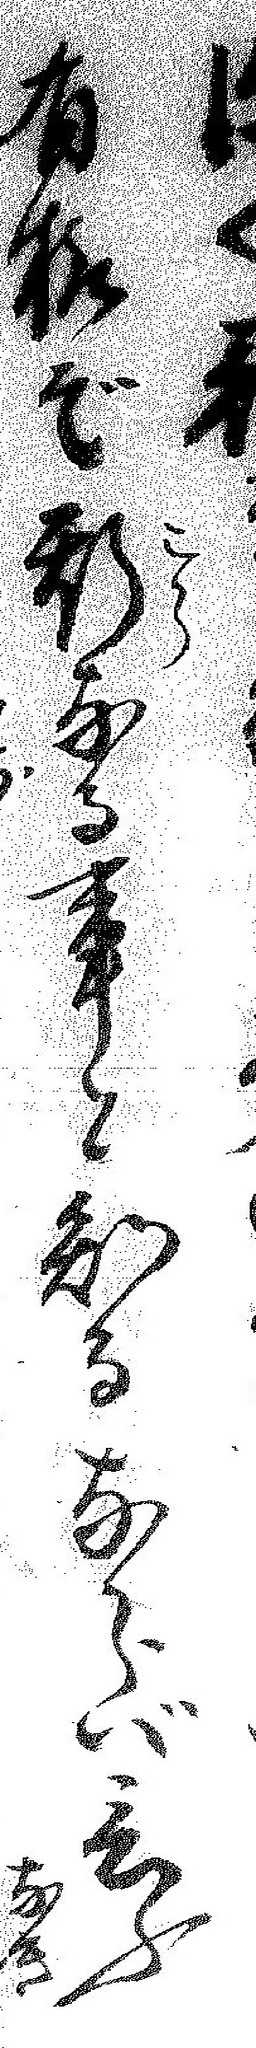有様ぞ斯なる事と知るならば言ふ
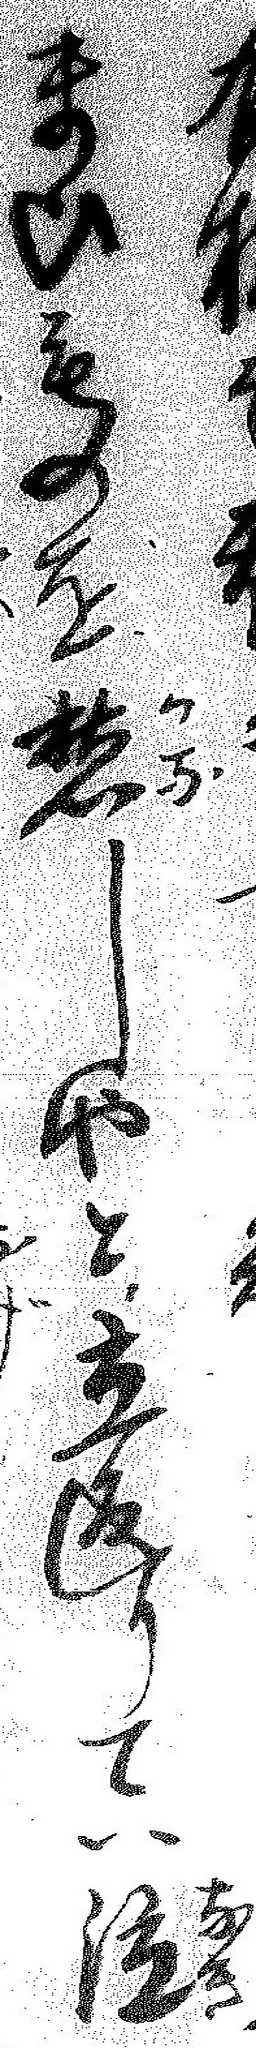まひものを悲しやと立返りては泣
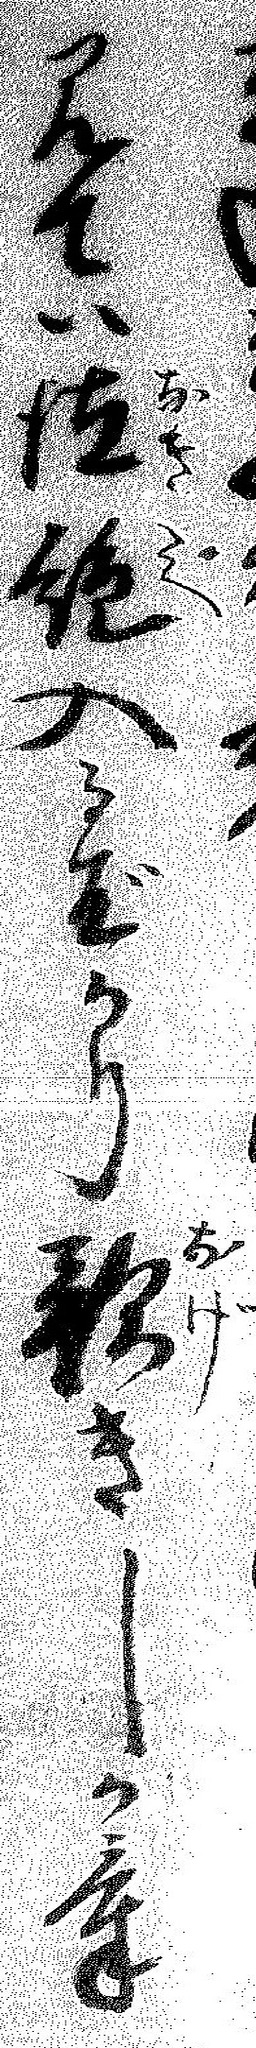見ては泣絶入るばかり歎きしか気

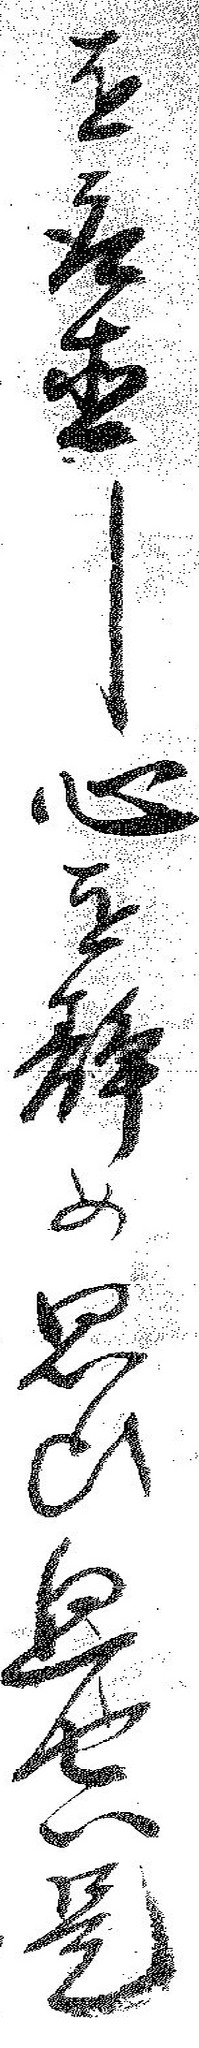を取直し心を静め思ひ廻せは是
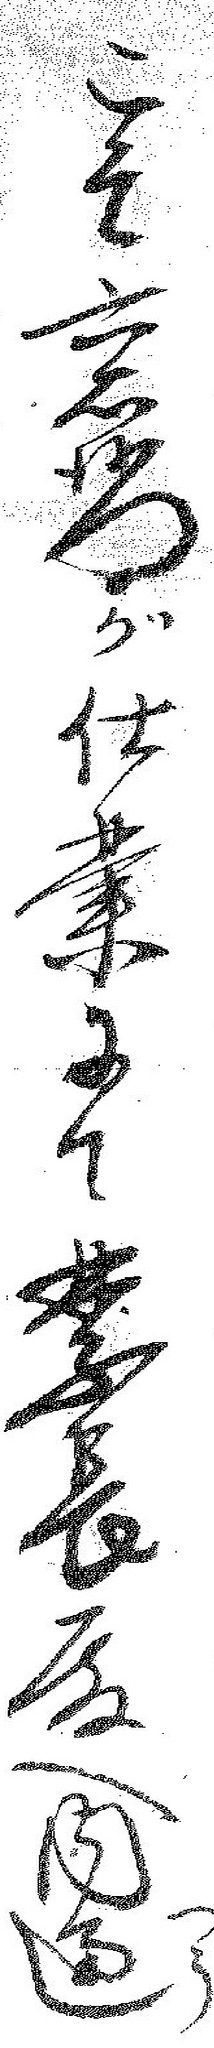こそ六右衛門が仕業にて禁長殿へ内通
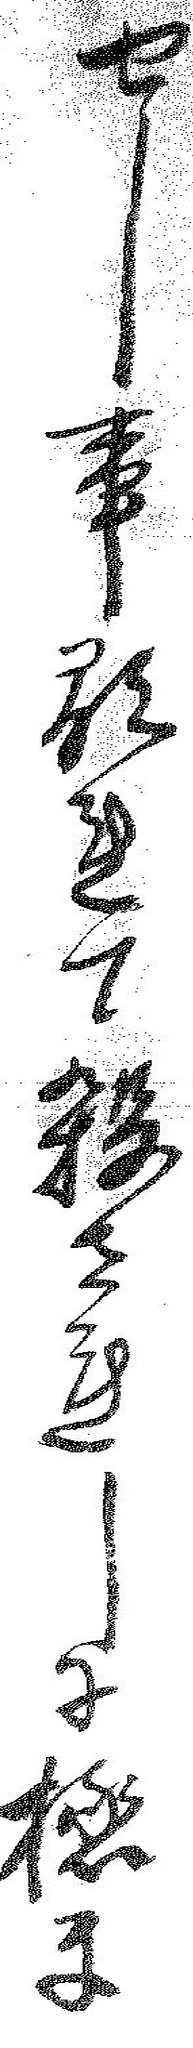せし事顕れて殺されしに極ま
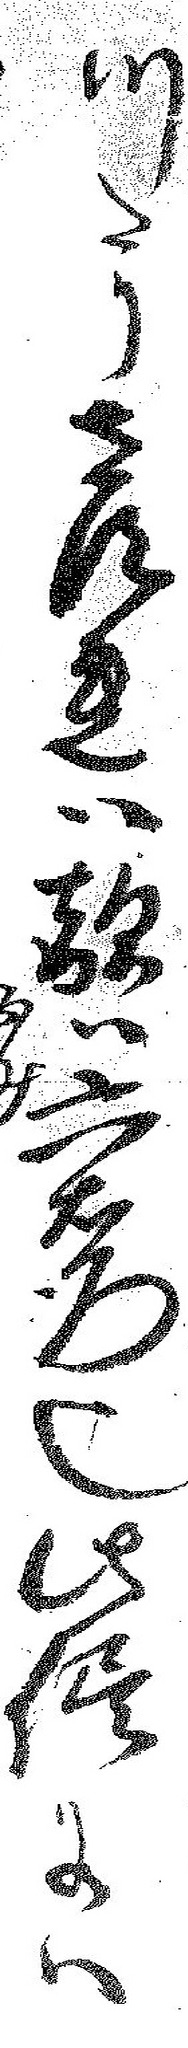つたりさすれは敵は六右衛門也此侭には
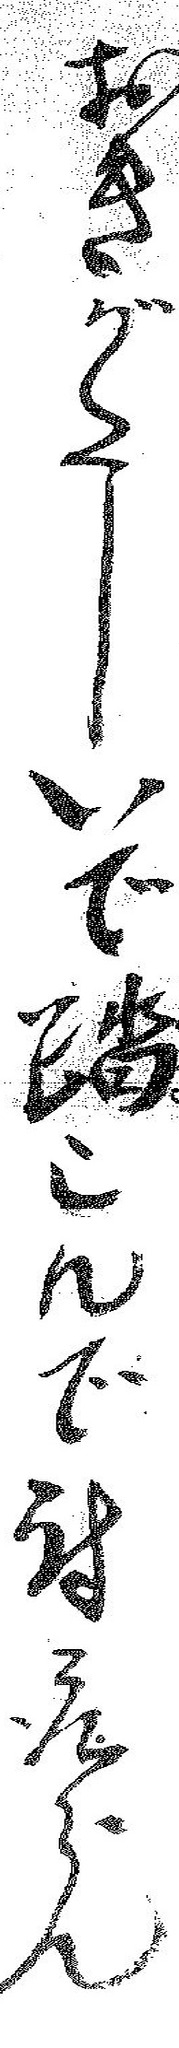おきがたしいで踏こんで討取らん
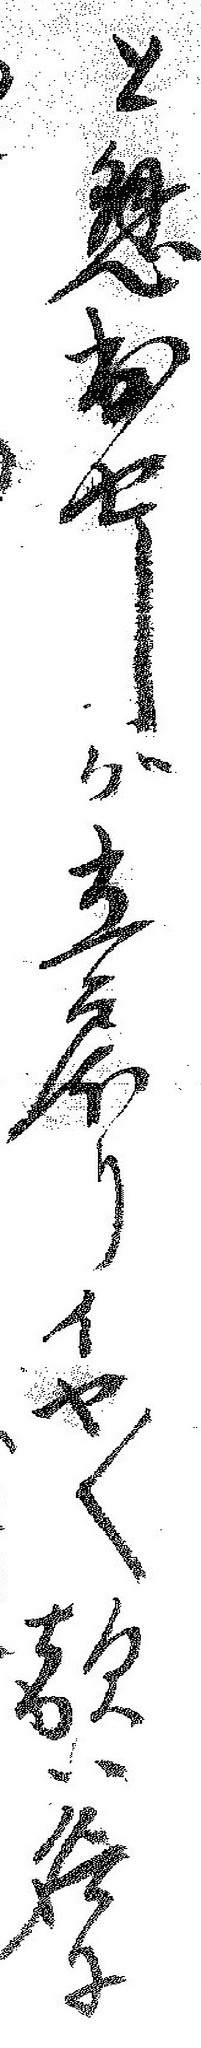と懸出せしが立戻りイヤ〳〵敵は名に
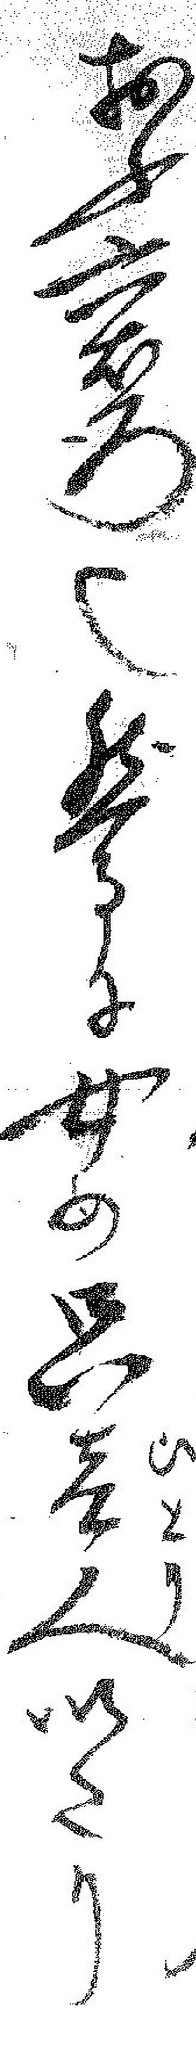おふ六右衛門也然るに女の只壱人いたり
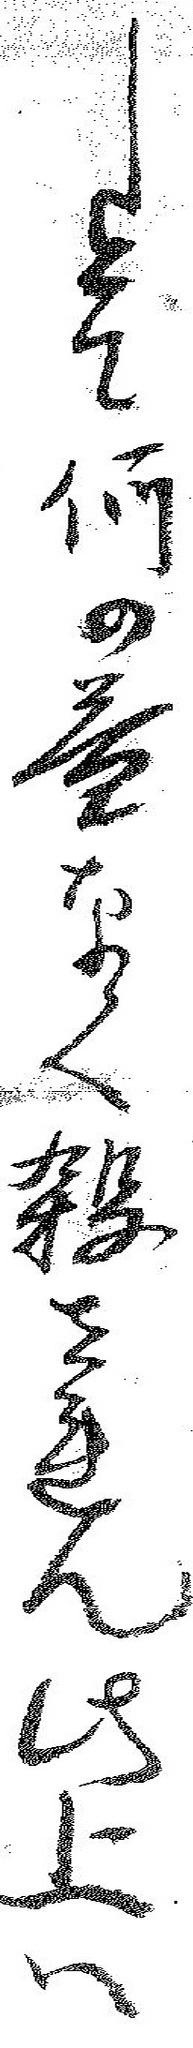しとて何の益なく殺されん此上は
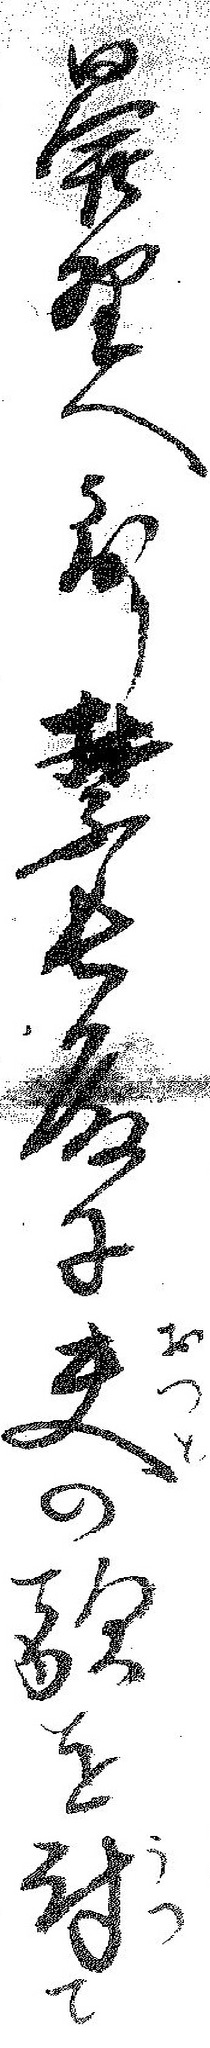日開野へ至り禁長殿に夫の敵を討て
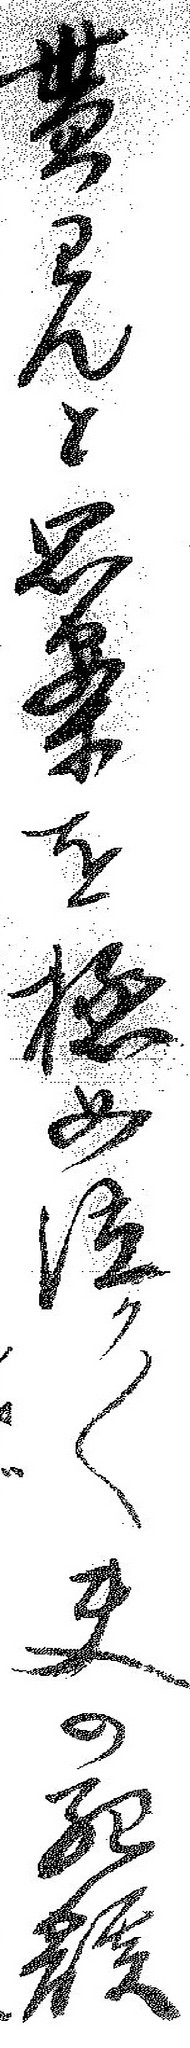貰わんと思案を極め泣く〳〵夫の死骸
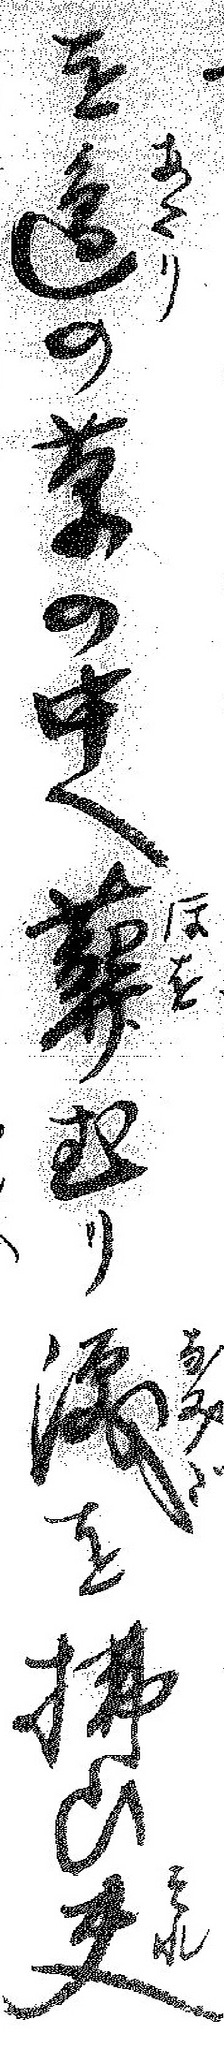を辺の草の中へ葬むり涙を払ひ夫
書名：近頃古狸珍説　礼義智信
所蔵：徳島県立図書館
